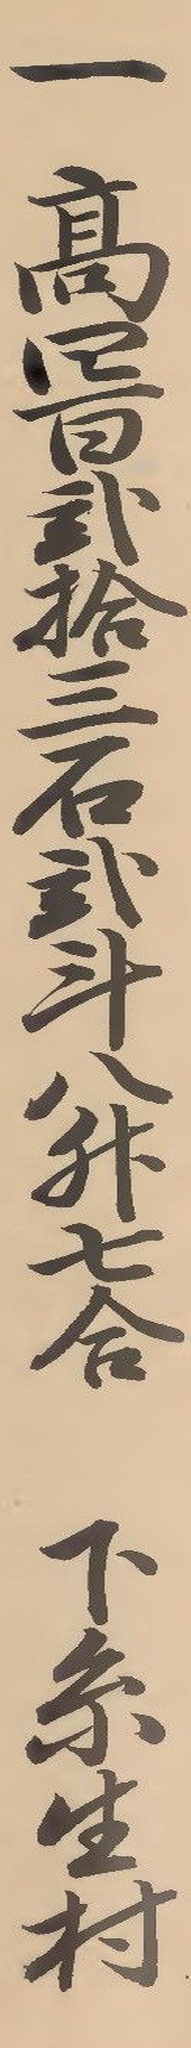一高四百弐拾三石弐斗八升七合下糸生村
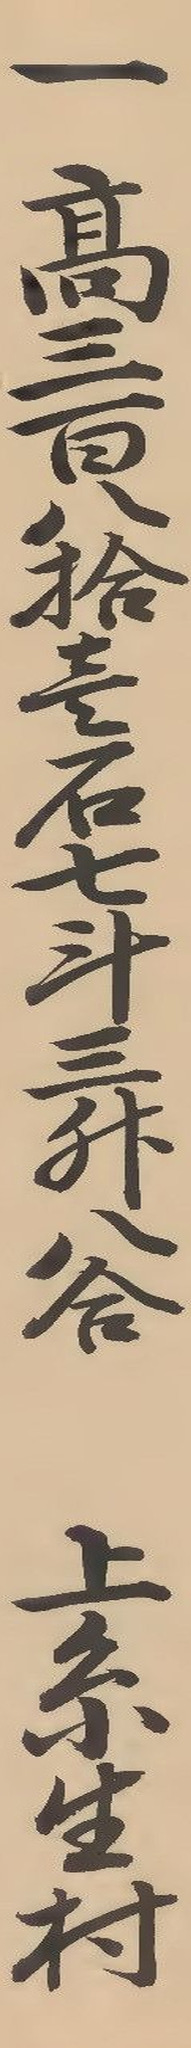一高三百八拾壱石七斗三升八合上糸生村
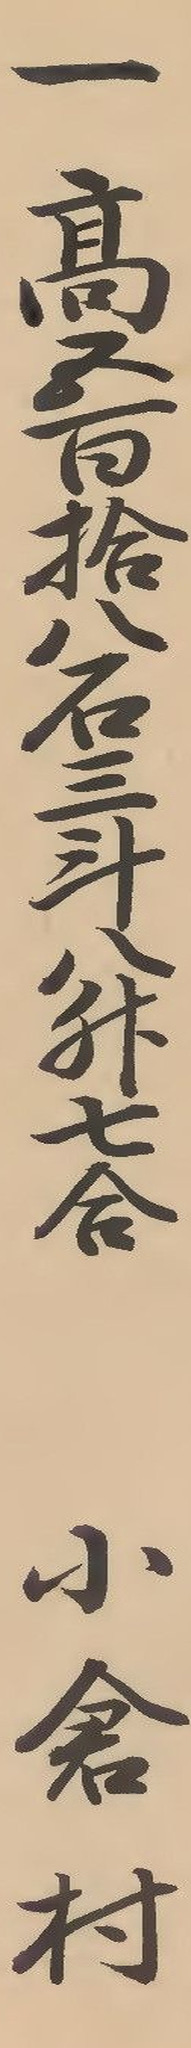一高五百拾八石三斗八升七合小倉村
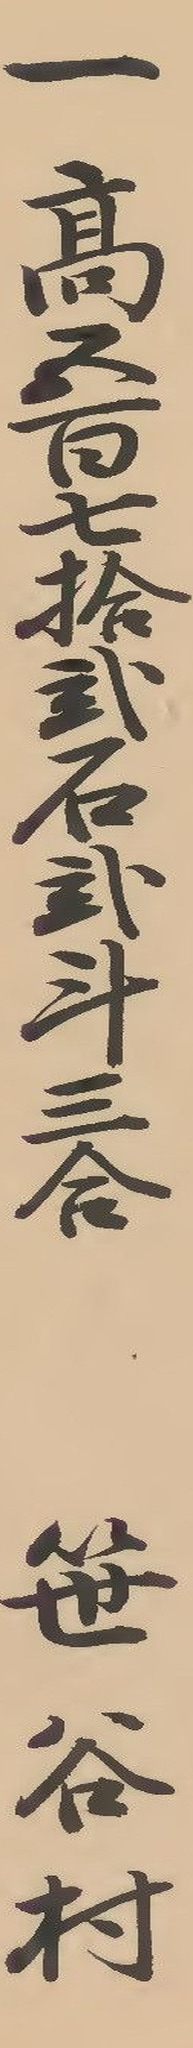一高五百七拾弐石弐斗三合笹谷村

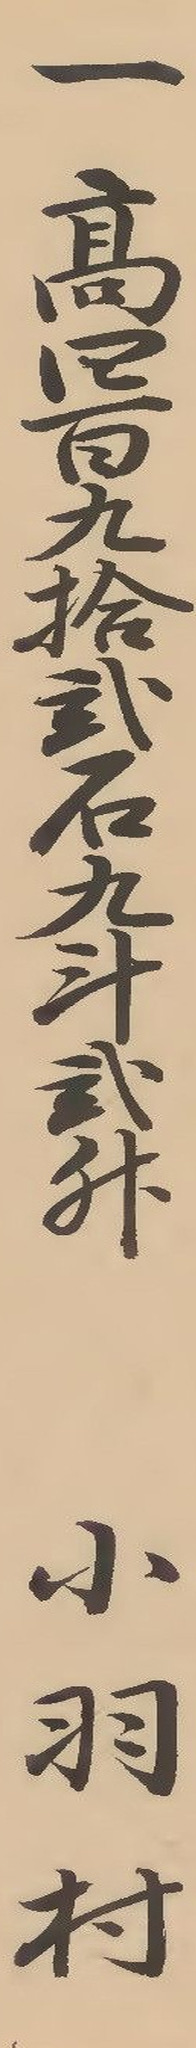一高四百九拾弐石九斗弐升小羽村
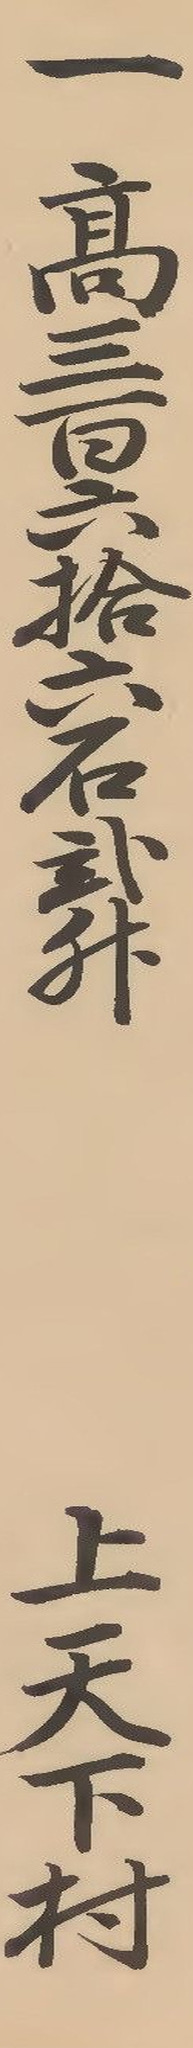一高三百六拾六石弐升上天下村
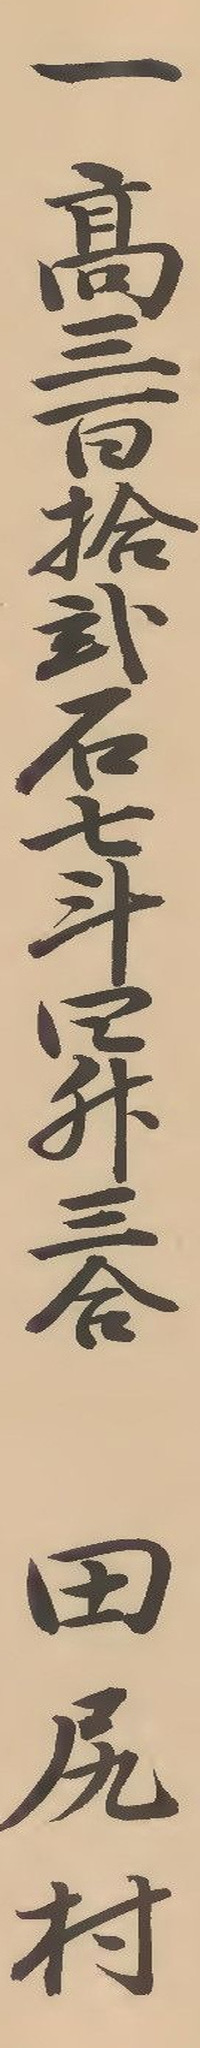一高三百拾弐石七斗四升三合田尻村
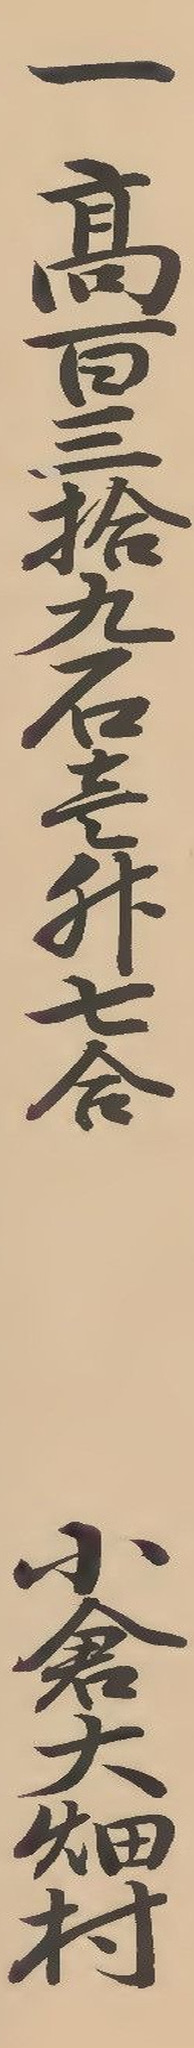一高百三拾九石壱升七合小倉大畑村
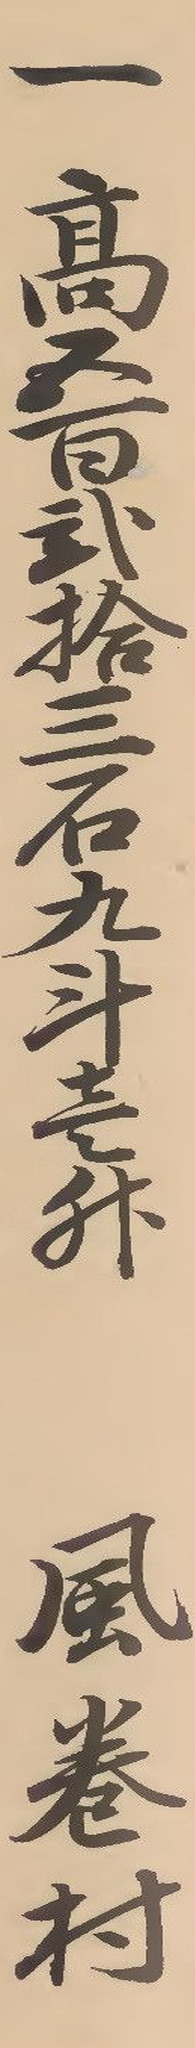一高五百弐拾三石九斗壱升風巻村
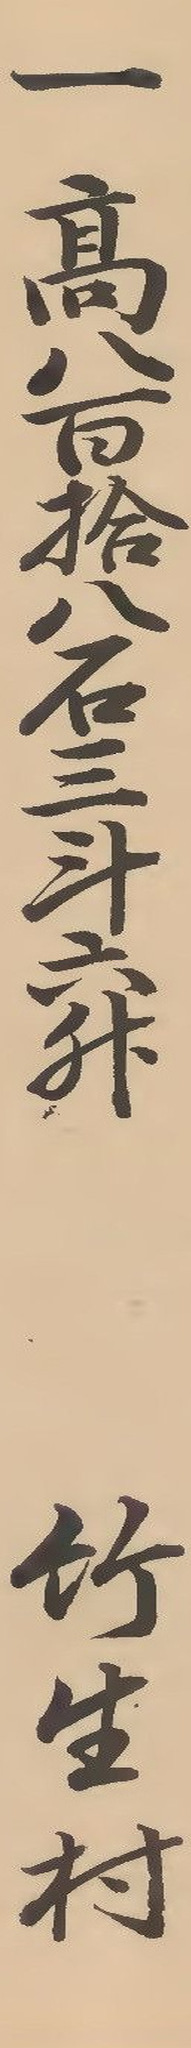一高八百拾八石三斗六升竹生村
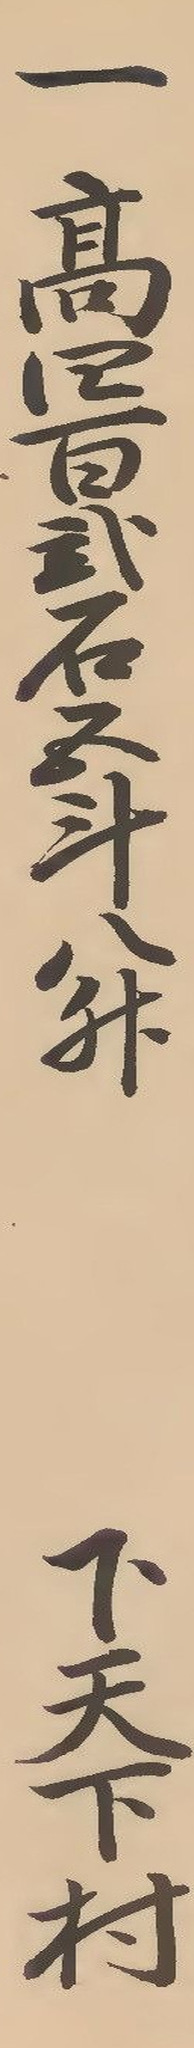一高四百弐石五斗八升下天下村
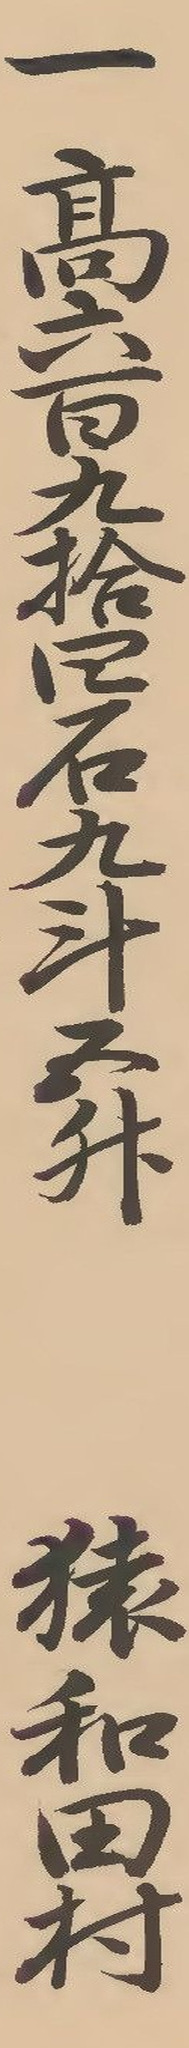一高六百九拾四石九斗五升猿和田村

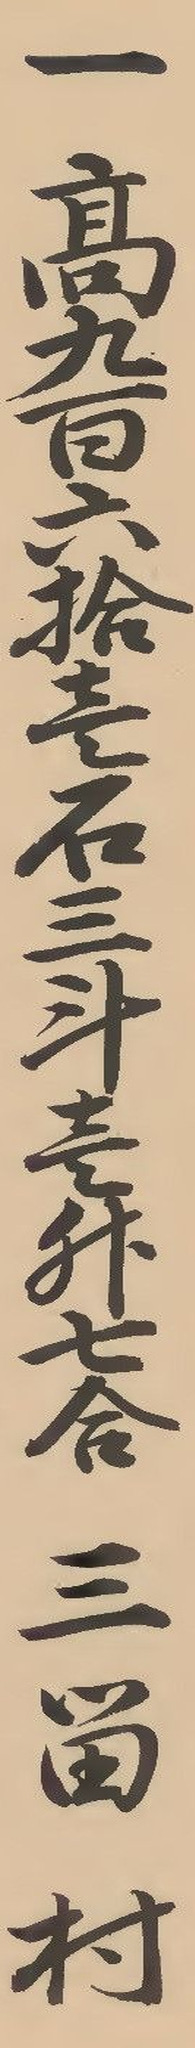一高九百六拾壱石三斗壱升七合三留村
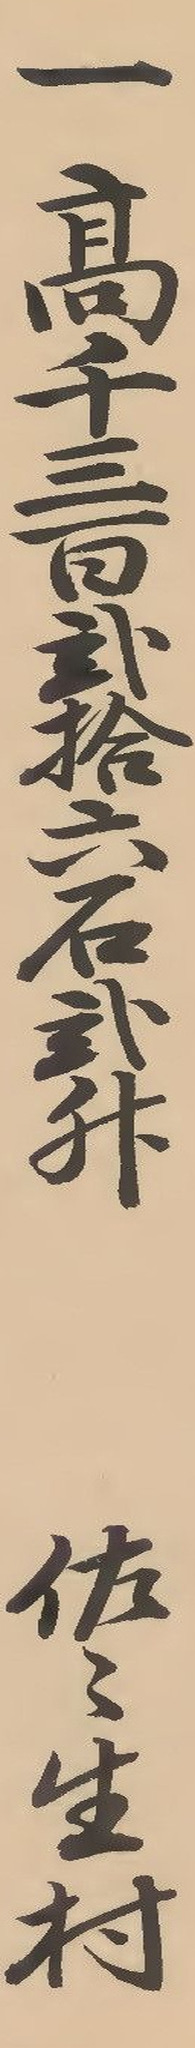一高千三百弐拾六石弐升佐々生村
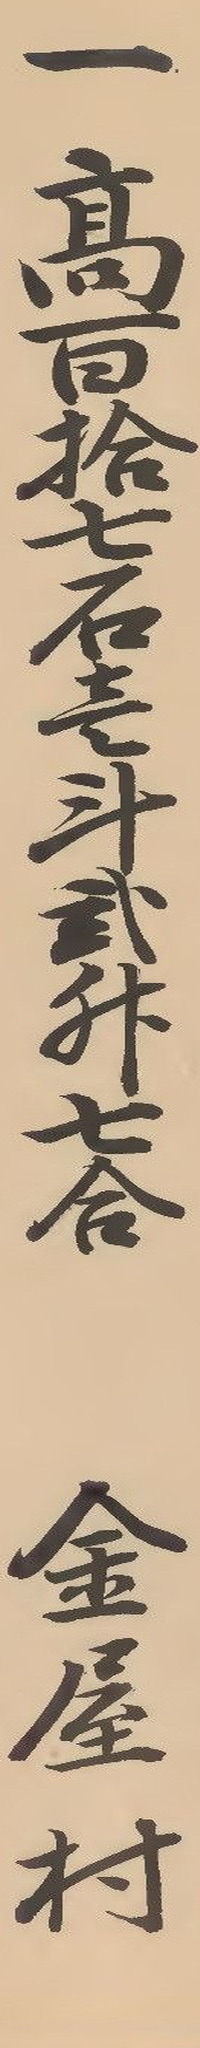一高百拾七石壱斗弐升七合金屋村
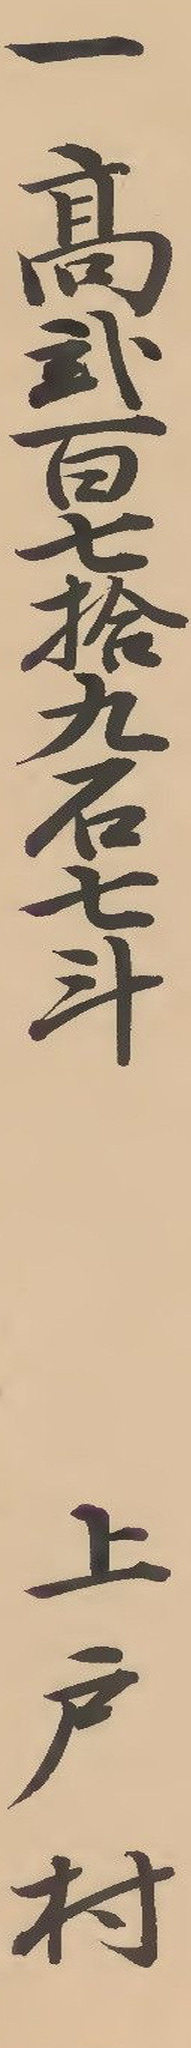一高弐百七拾九石七斗上戸村
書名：越前国郷帳
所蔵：国立公文書館 National Archives of Japan
